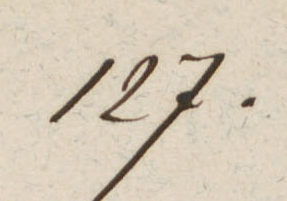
127.
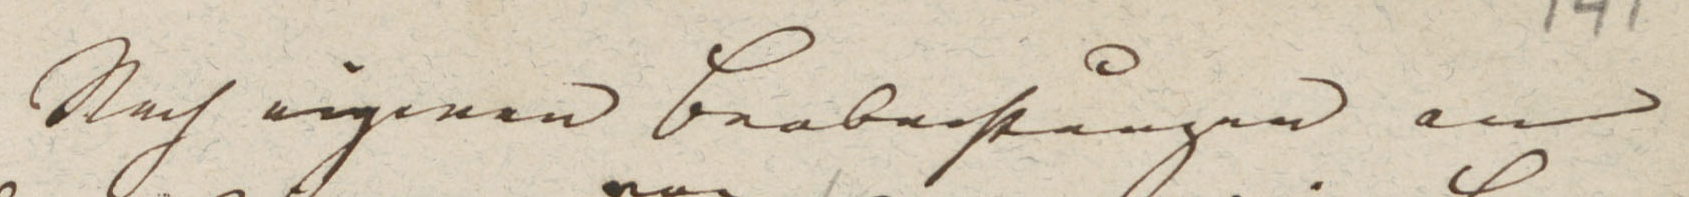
Nach eigenen Beobachtungen an
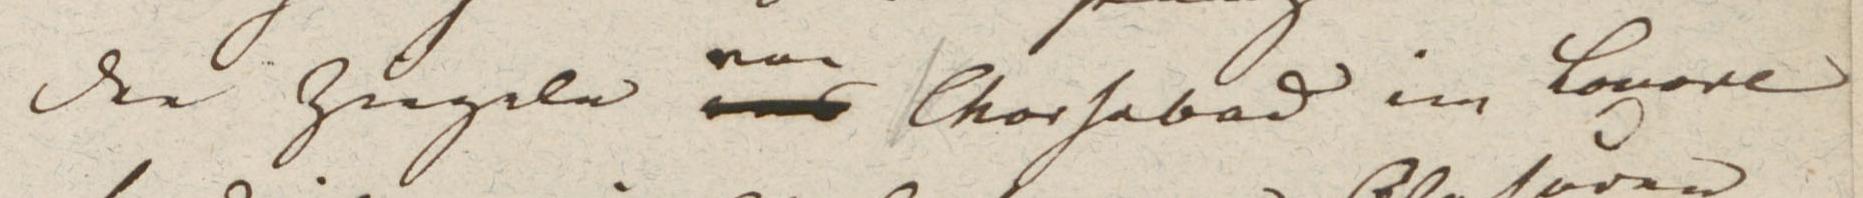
den Ziegeln aus von Chorsabad im Louvre
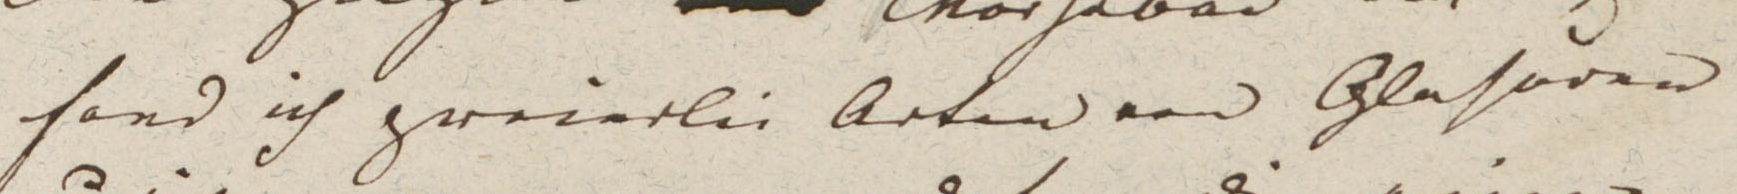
fand ich zweierlei Arten von Glasuren
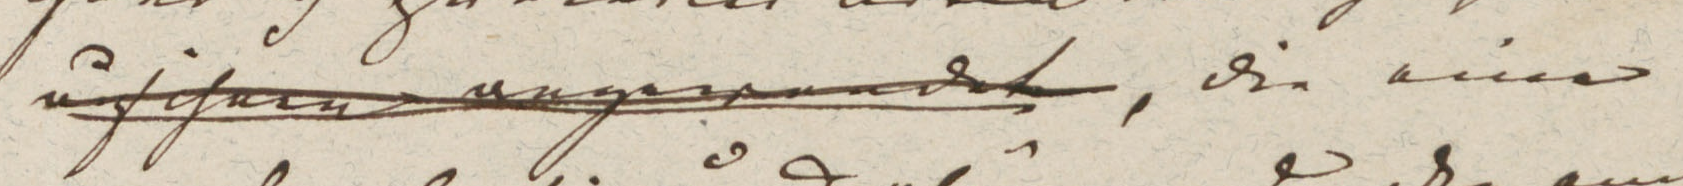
auf ihnen angewendet, die eine
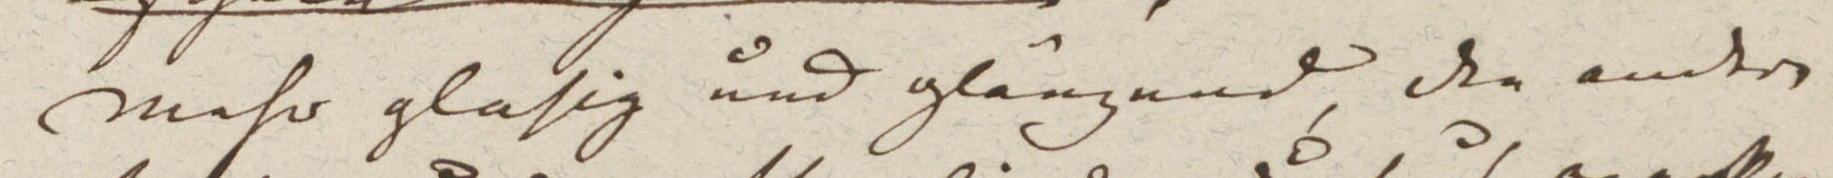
mehr glasig und glänzend, die andere
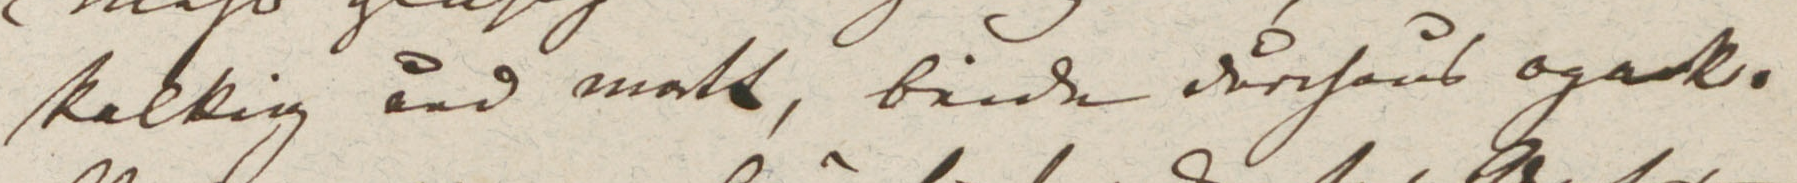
kalkig und matt, beide durchaus opak.
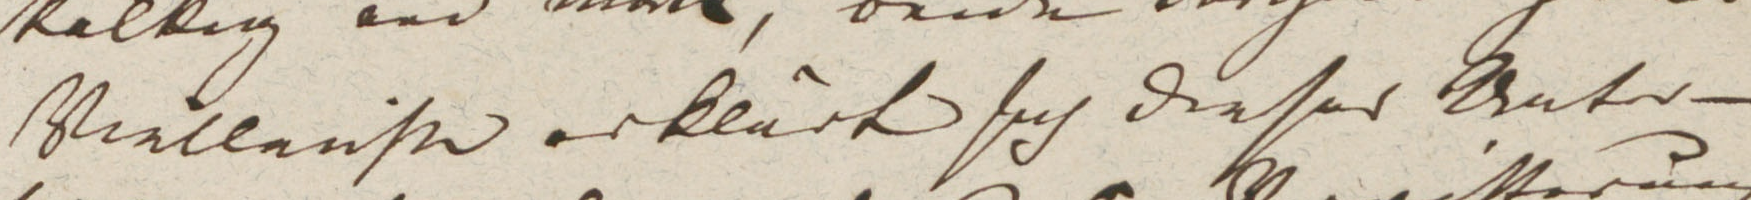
Vielleicht erklärt sich dieser Unter-
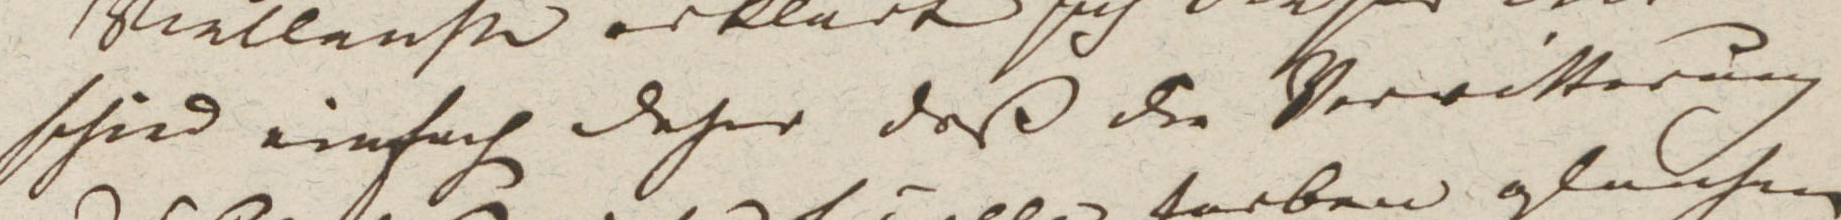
schied einfach daher dass die Verwitterung
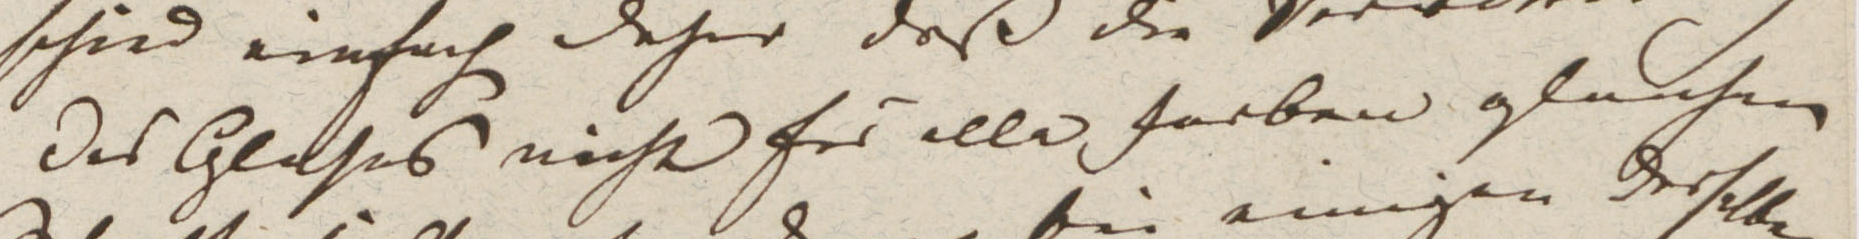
des Glases nicht für alle Farben gleichen
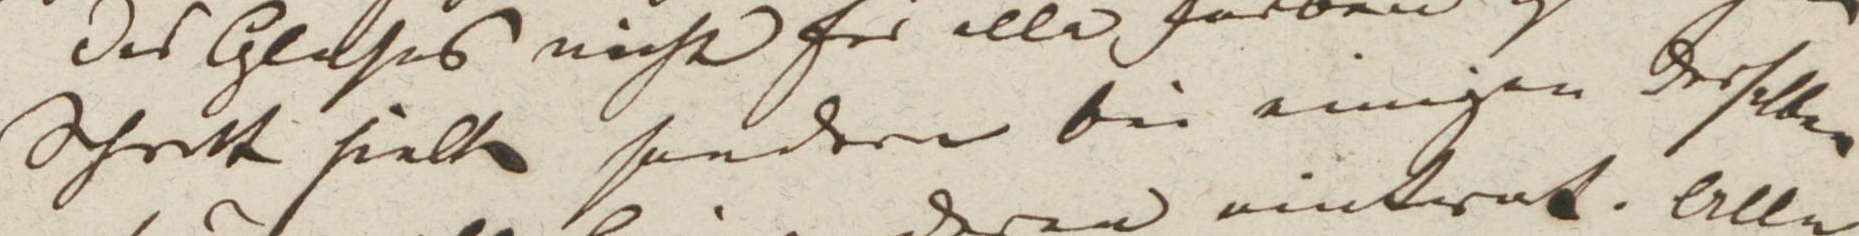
Schritt hielt sondern bei einigen derselben
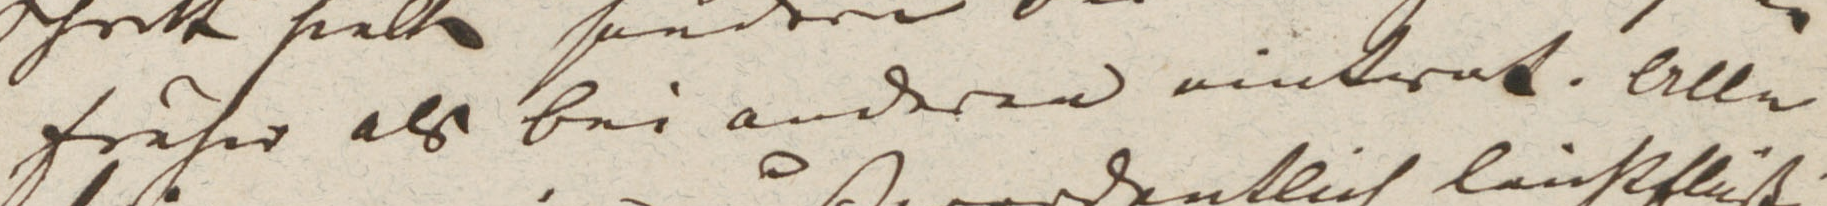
früher als bei anderen eintrat. Alle
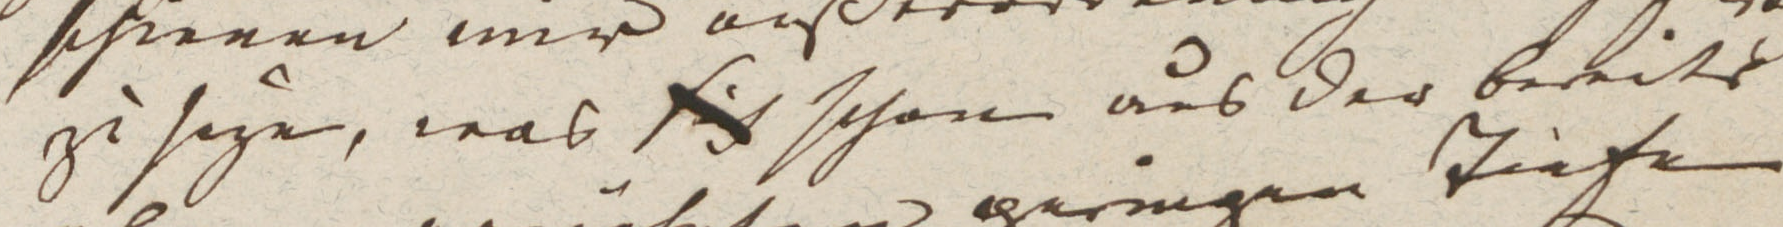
zu seyn, was sich schon aus der bereits
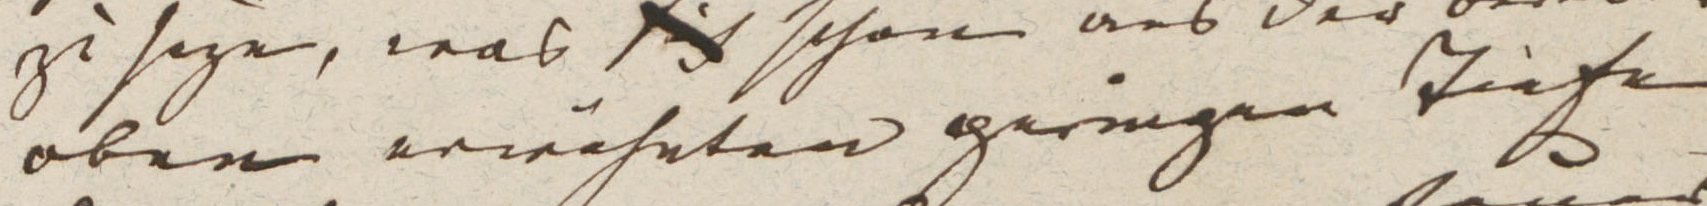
oben erwähnten geringen Tiefe
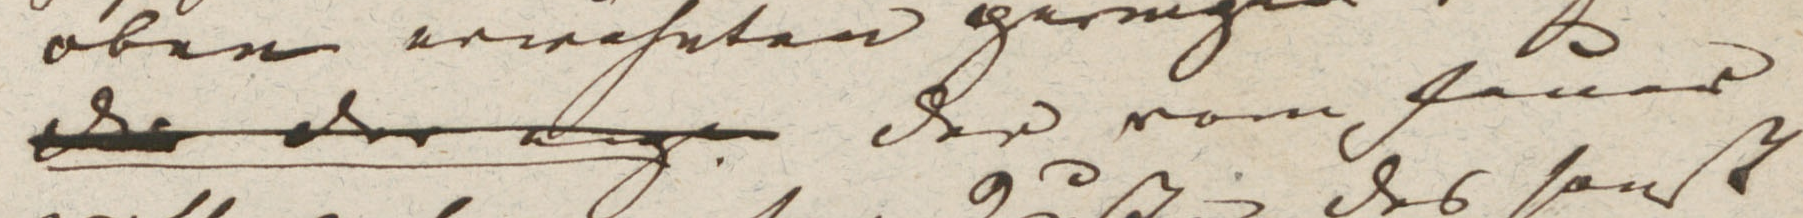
der der eige der vom Feuer
